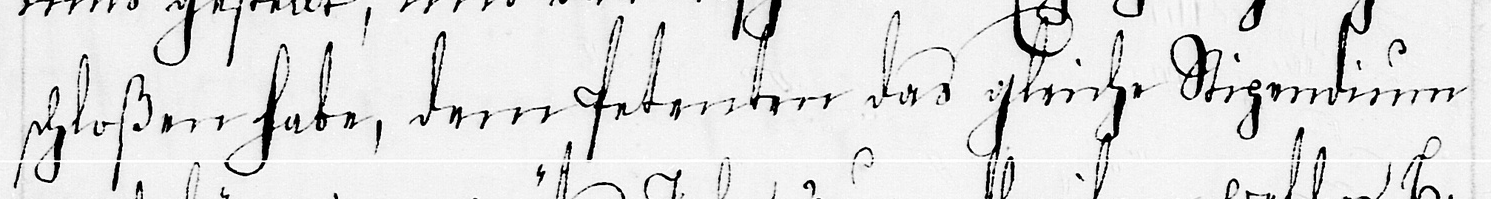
schloßen habe, dem Petenten das gleiche Stipendium
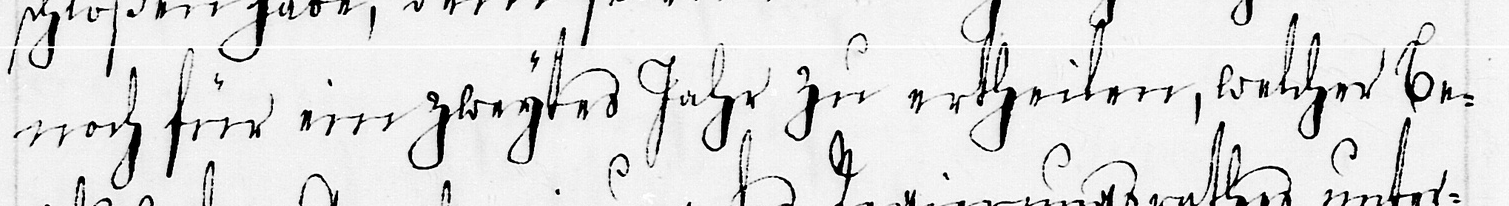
noch für ein zweytes Jahr zu ertheilen, welcher Be¬
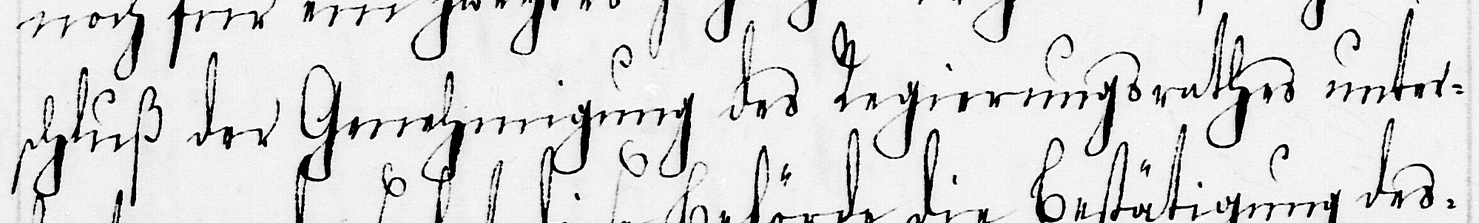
schluß der Genehmigung des Regierungsrathes unter¬
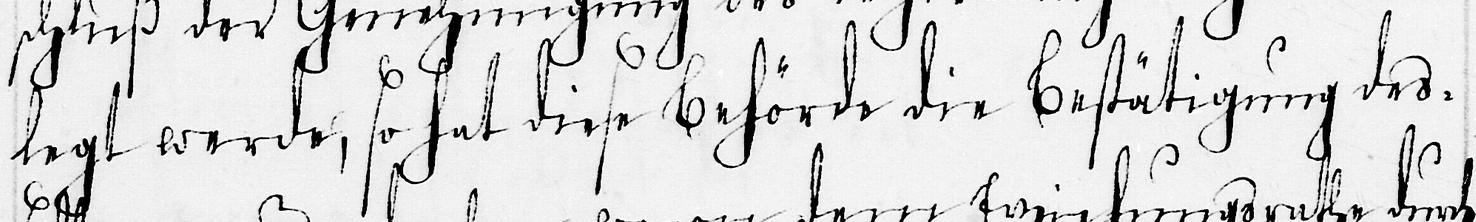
legt werde, so hat diese Behörde die Bestätigung des¬
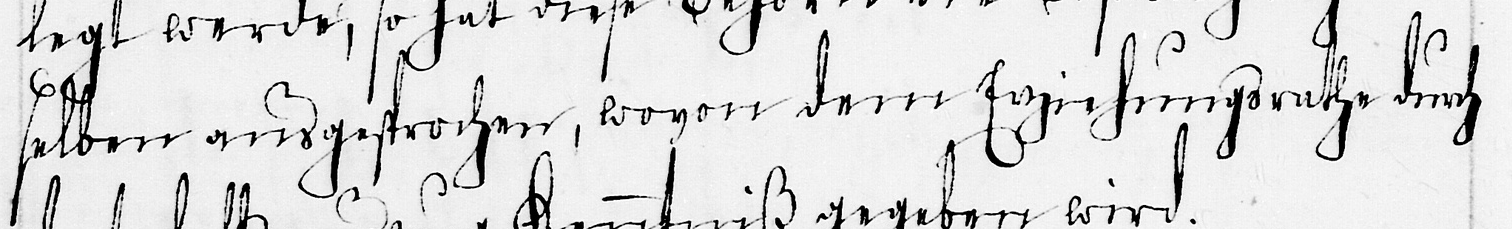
selben ausgesprochen, wovon dem Erziehungsrathe durch
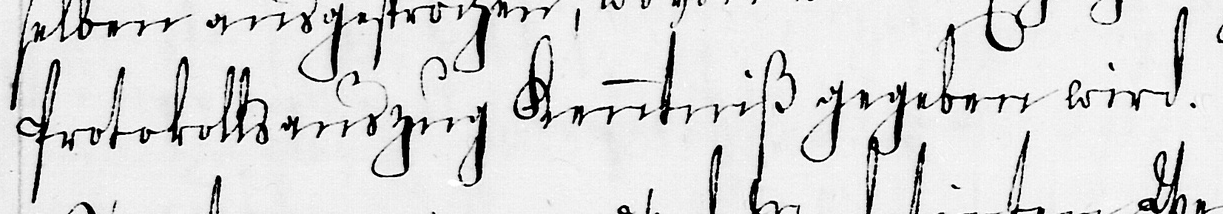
Protokollsauszug Kenntniß gegeben wird.
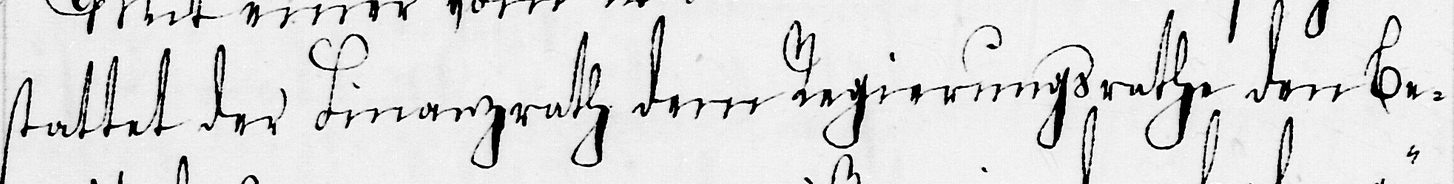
stattet der Finanzrath dem Regierungsrathe den Be¬
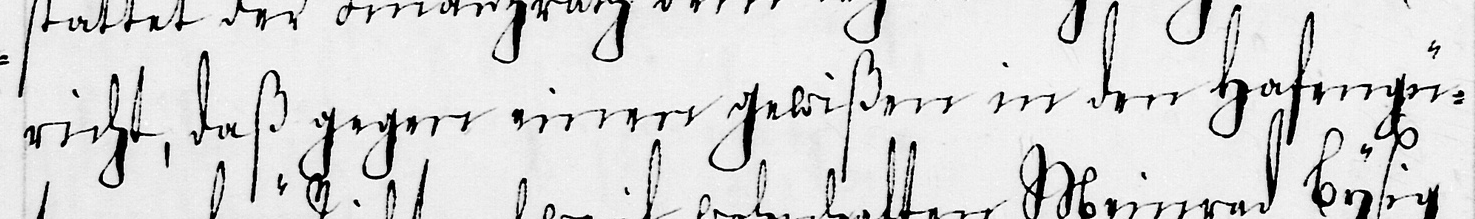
richt, daß gegen einen gewißen in den Hafengü¬
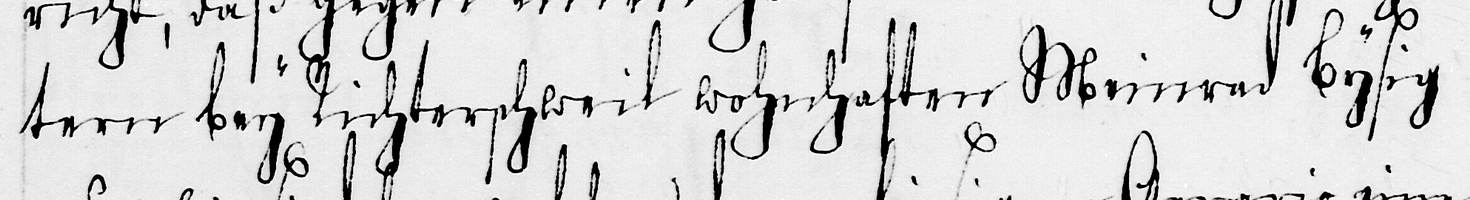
tern bey Richterschweil wohnhaften Meinrad Bysig
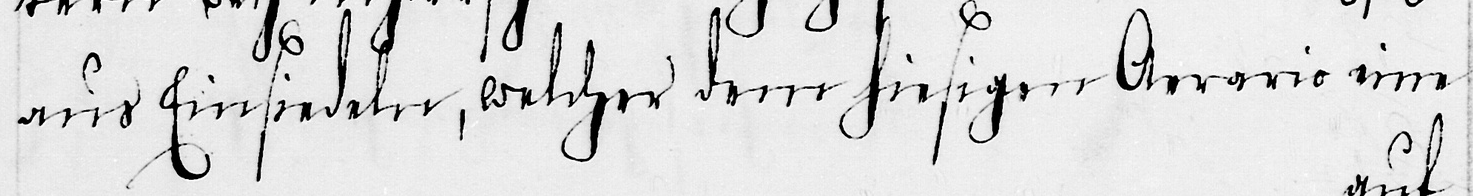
aus Einsiedeln, welcher dem hiesigen Aerario eine
